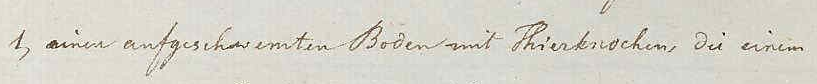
1, einen aufgeschwemten Boden mit Thierknochen, die einem
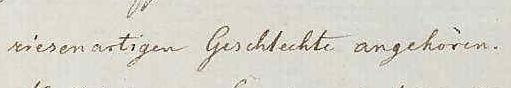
riesenartigen Geschlechte angehören.
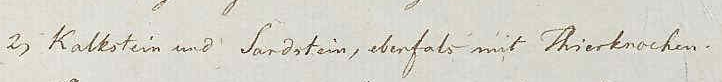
2, Kalkstein und Sandstein, ebenfals mit Thierknochen.
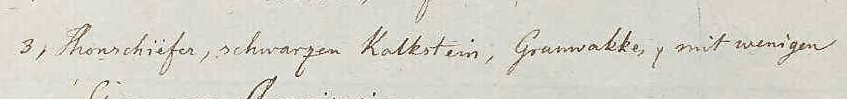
3, Thonschiefer, schwarzen Kalkstein, Grauwakke, p mit wenigen
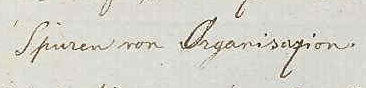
Spuren von Organisazion.
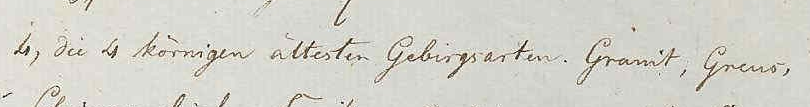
4, die 4 körnigen ältesten Gebirgsarten. Granit, Gneus,
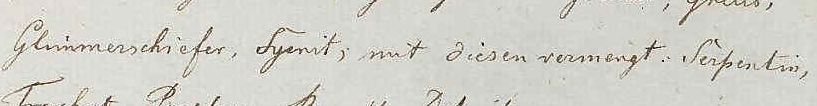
Glimmerschiefer, Syenit, mit diesen vermengt: Serpentin,
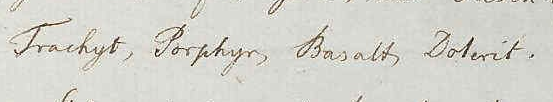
Trachyt, Porphyr, Basalt, Dolerit.
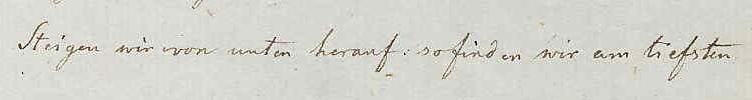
Steigen wir von unten herauf: so finden wir am tiefsten
